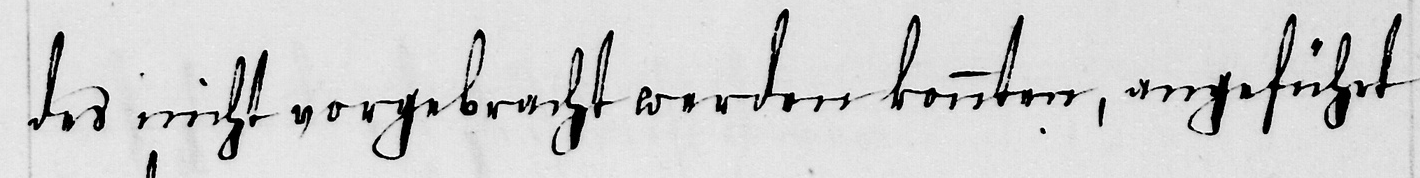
des nicht vorgebracht werden konnten, angeführt
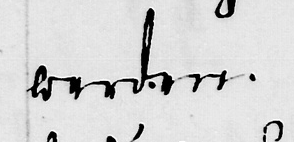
werden.
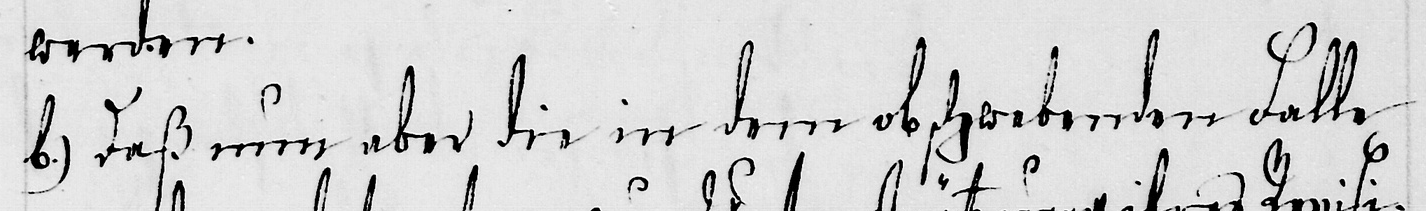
b.) Daß nun aber die in dem obschwebenden Falle
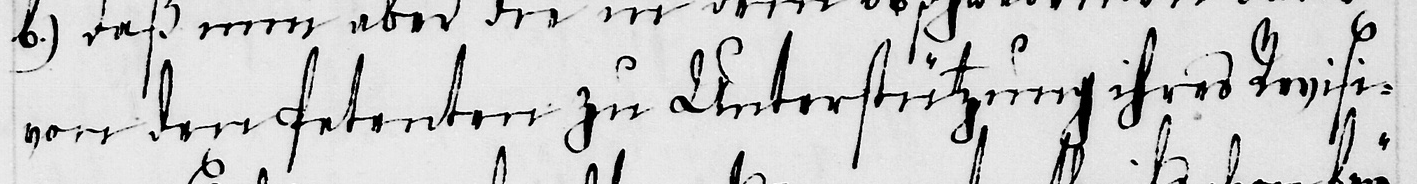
von den Petenten zu Unterstützung ihres Revisi¬
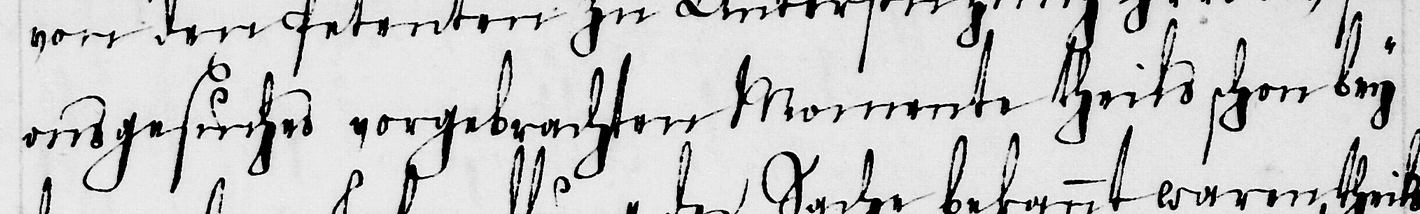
onsgesuches vorgebrachten Momente theils schon bey
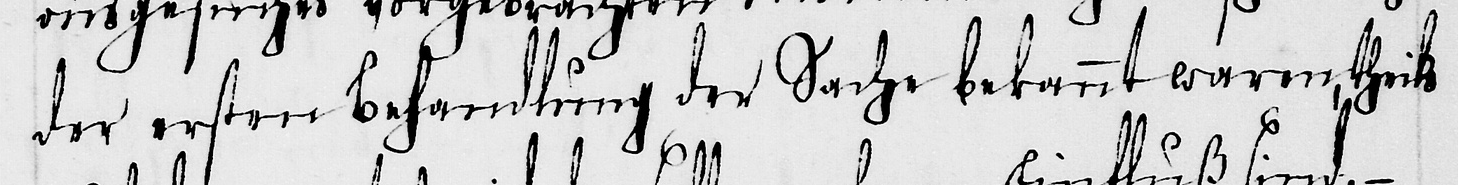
der ersten Behandlung der Sache bekannt waren, theils
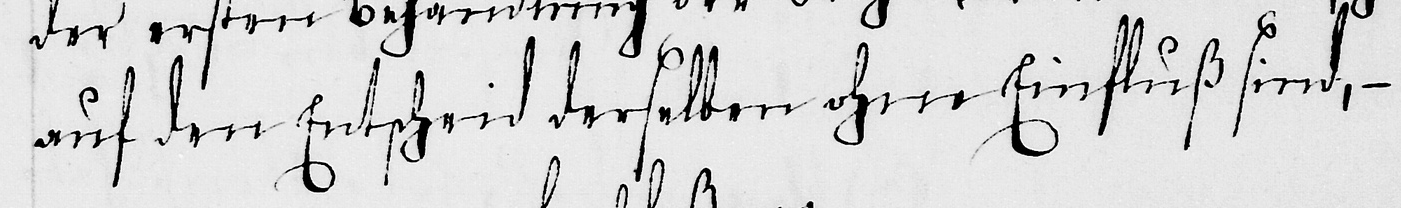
auf den Entscheid derselben ohne Einfluß sind;
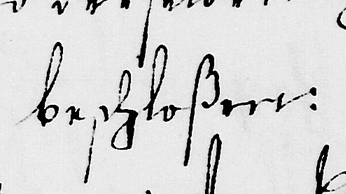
beschloßen:
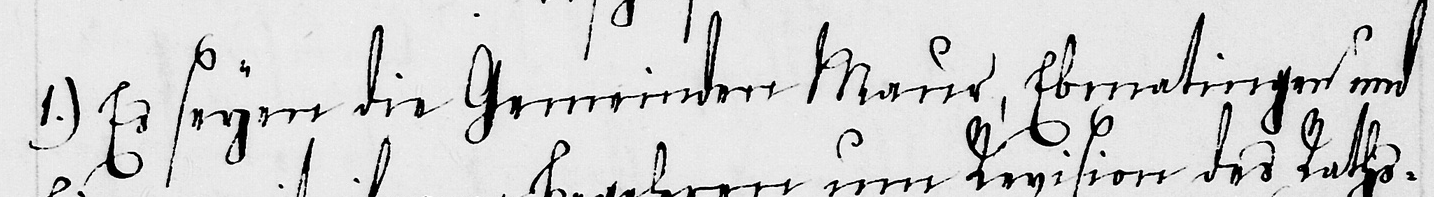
1.) Es seyen die Gemeinden Maur, Ebmatingen und
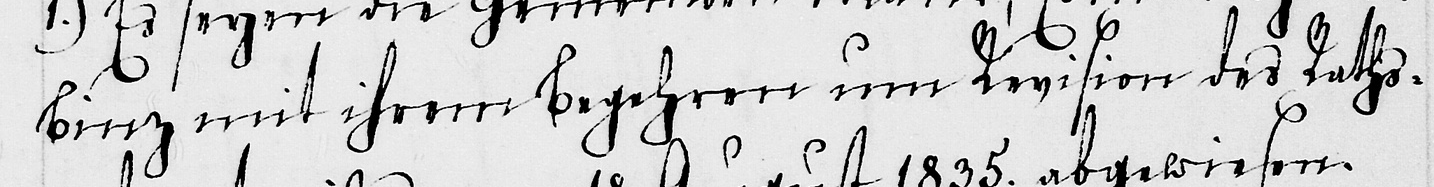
Binz mit ihrem Begehren um Revision des Raths¬
